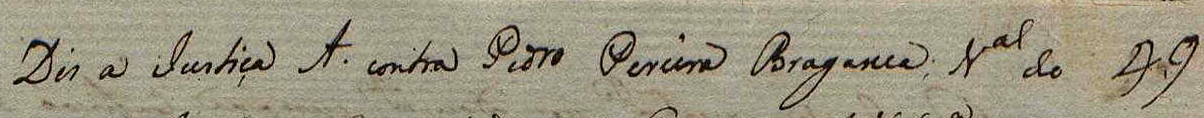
Dis a Iustiça A. contra Pedro Pereira Bragança. N.al do 49
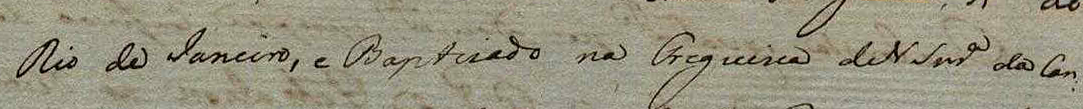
Rio de Ianeiro, e Baptizado na Freguesia de N Snra da Can
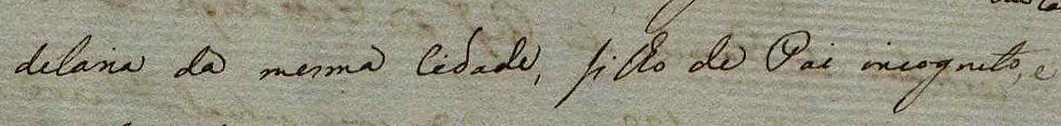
delaria da mesma Cidade, filho de Pai incognito, e
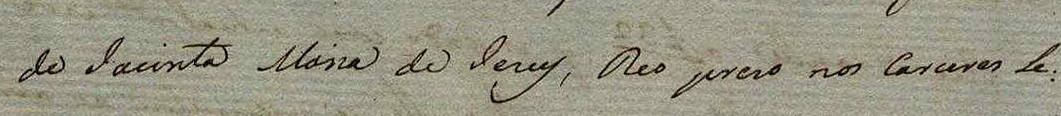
de Iacinta Maria de Iezus, Reo preso nos carceres Se
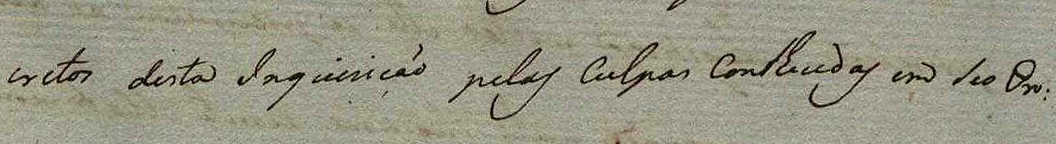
cretos desta Inquisiçao pelas Culpas Contheudas em seo Pro
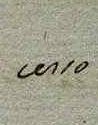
cesso
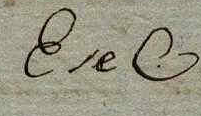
E se C
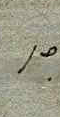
1.º
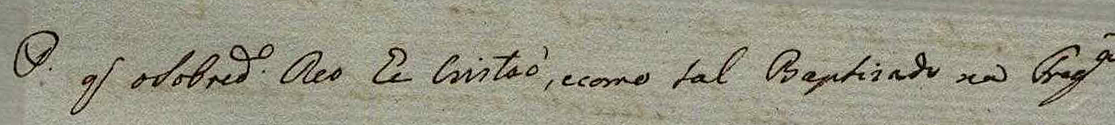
P. q̄ o Sobred.o Reo he Cristaõ, e como tal Baptizado na Frega
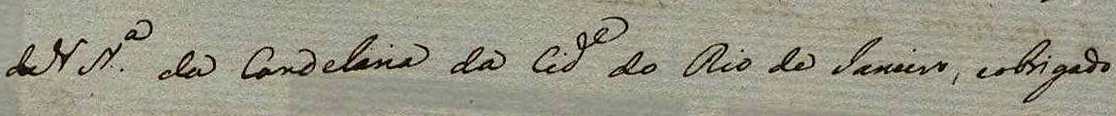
da N Sr.a da Candelaria da Cide do Rio de Ianeiro, e obrigado
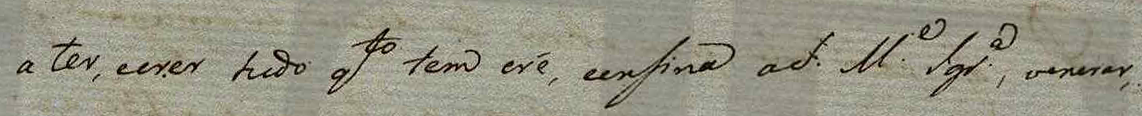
a ter, e crer tudo qto tem cré, e ensina a S. M.e Igr.a, venerar,
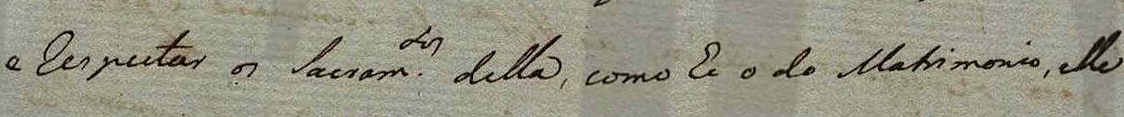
e Respeitar os Sacram.tos della, como he o do Matrimonio, elle
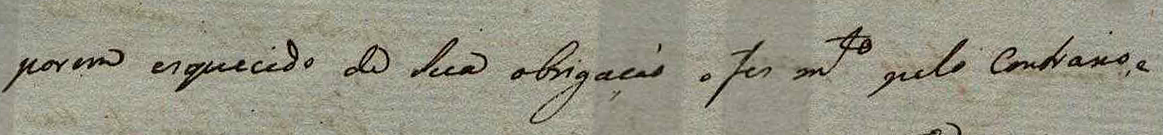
porem esquecido de Sua obrigaçaõ o fes m.to pelo Contrario, e
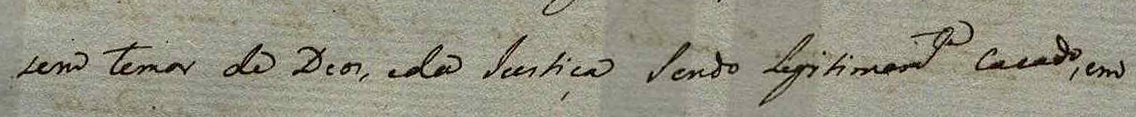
sem temor de Deos, e da Iustiça, Sendo Legitimamte cazado, em
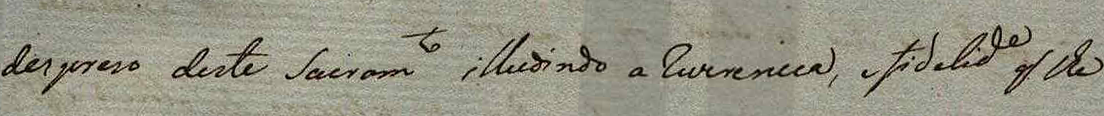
despreso deste Sacramto, illudindo a Reverencia, e fidelide q̄ lhe
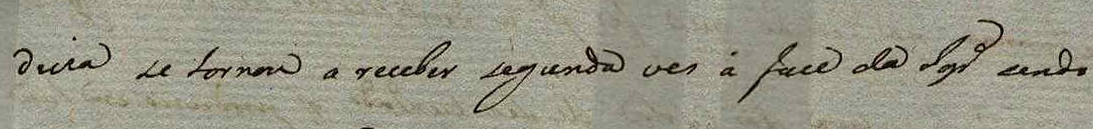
devia se tornou a receber segunda ves á face da Igra sendo
